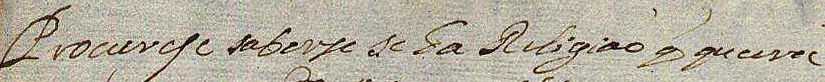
Procurese saberse se ha Religiaõ q̄ queira
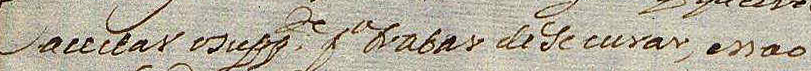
aceitar o supp.te pa tratar de se curar, e naõ
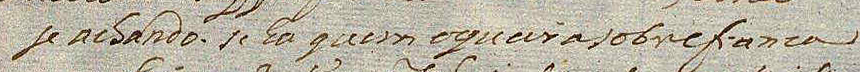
se achando. se ha quem o queira sobre fiança
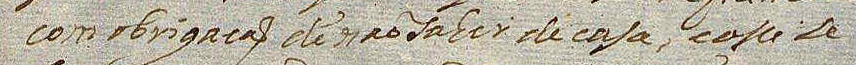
com obrigaçaõ de naõ sahir de casa, e assi se
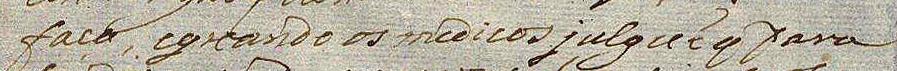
faça, e quando os medicos julguē q̄ para
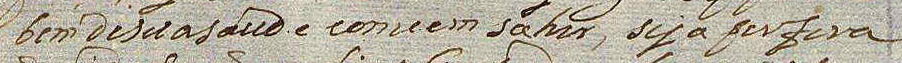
bem de sua saude conuem sahir, seja por fora
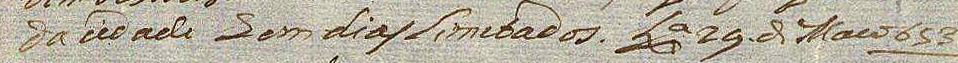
da cidade E em dias limitados. Lxa 29. de Maio 653
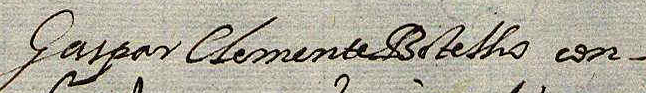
Gaspar Clemente Botelho con
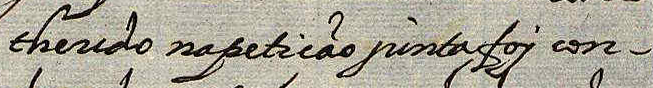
theudo na petiçaõ junta, foy con
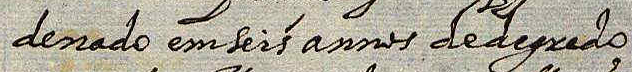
denado em seis annos de degredo
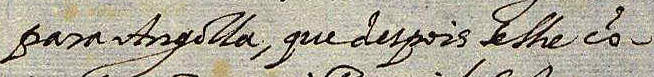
para Angolla, que despois se lhe cō
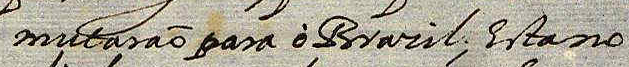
mutaraõ para o Brazil, Esta no
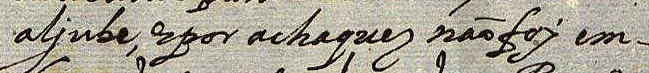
aljube, E por achaques naõ foy em
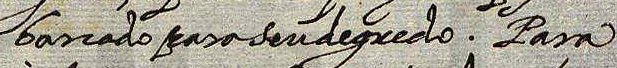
barcado para seu degredo. Para
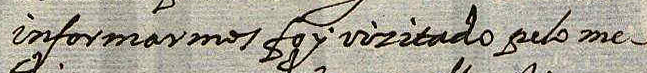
informarmos foy vizitado pelo me
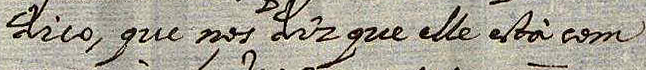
dico, que nos diz que elle está com
